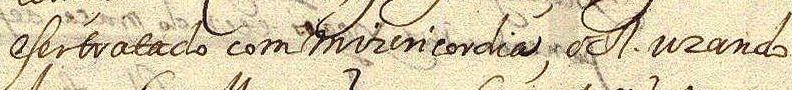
e Ser tratado com mizericordia, o R. uzando
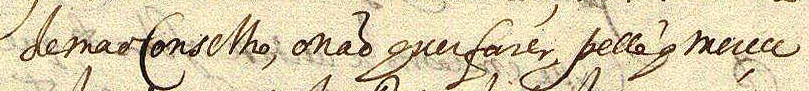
de mao Conselho, o naõ quer fazer pello q̄ mereçe
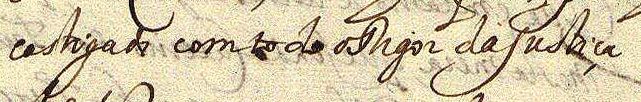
castigado com todo o Rigor da Justiça
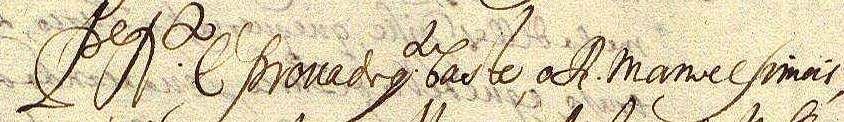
Pe R.to E proua do q.to baste o R. manoel Simois,
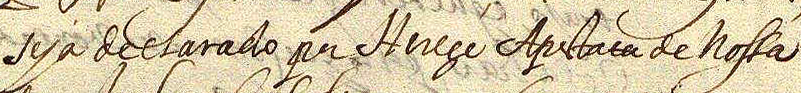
seja declarado por Herege Apostata de nossa
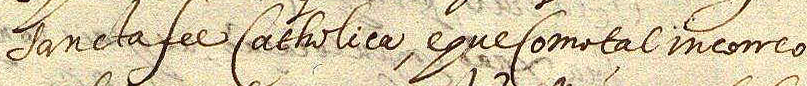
sancta fee Catholica, e que Como tal incorreo
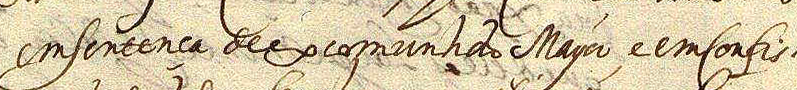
em Sentença de excomunhaõ Mayor, e em Confis
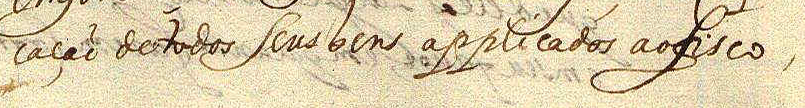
cação de todos Seus bens applicados ao fisco,
